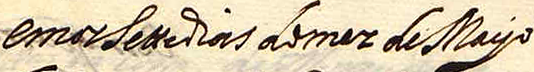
em os sette dias do mez de Mayo
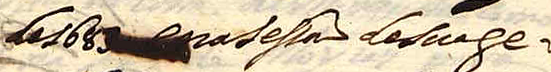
de 1683 _ na sessão de sua ge
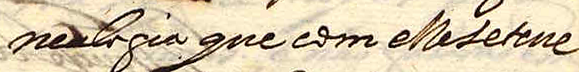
nealogia que com elle se teue
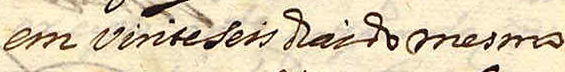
em vinte seis dias do mesmo
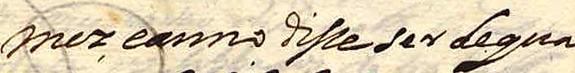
mez, e anno disse ser de qua
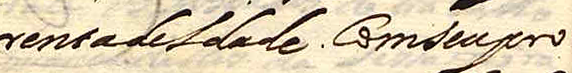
renta de Idade. Com seu pro
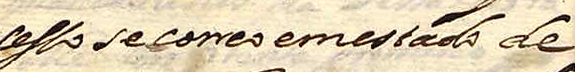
çesso se correo em estado de
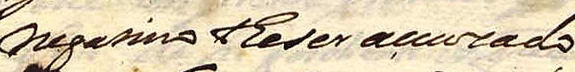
negatiuo the ser accuzado,
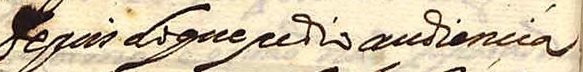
depois do que pedio audiençia
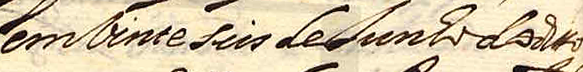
em vinte seis de Junho do ditto
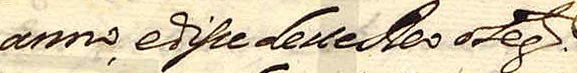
anno, e disse delle Reo o seg.te
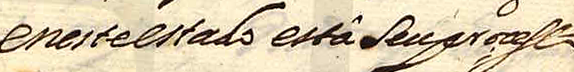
e neste estado está seu proçesso
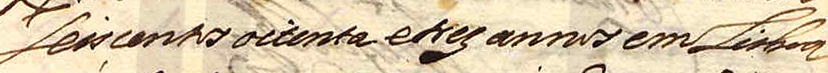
seisçentos oitenta e trez annos em Lisboa
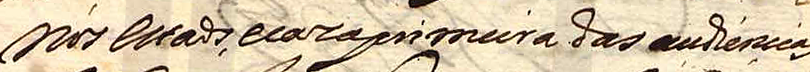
nos estaos, e caza primeira das audiençias
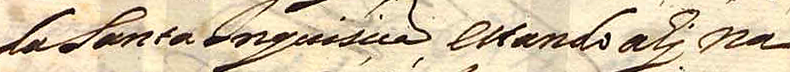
da Santa Inquisiçaõ, estando ahj na
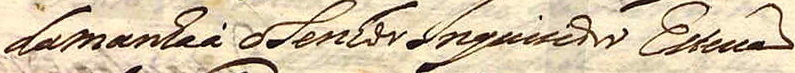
da manhaã o Senhor Inquisidor Esteuão
